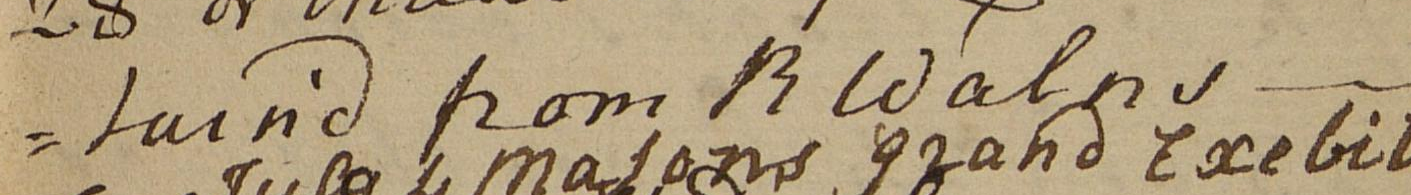-turn'd from R Walns-
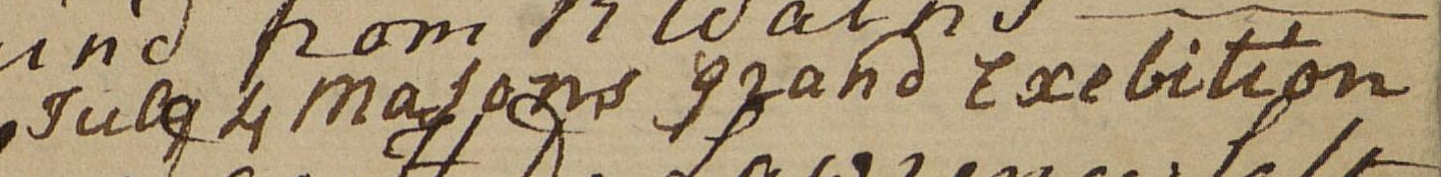July 4 Masons grand Exebition
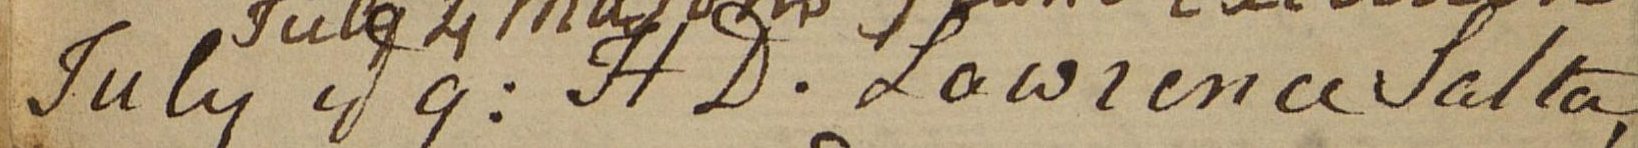July y^e 9: HD. Lawrence Salta,
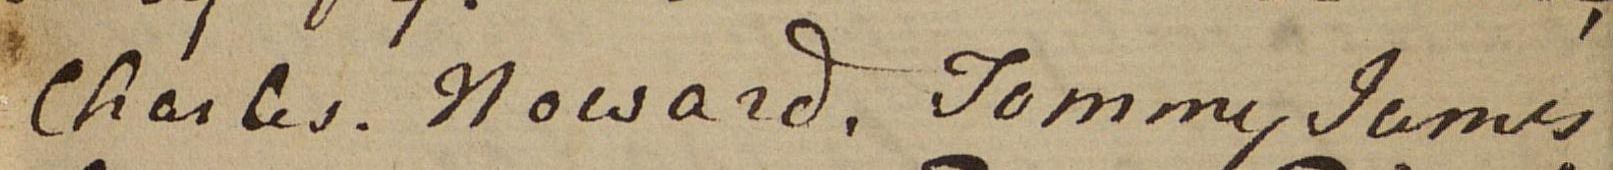Charles Noward, Tommy James
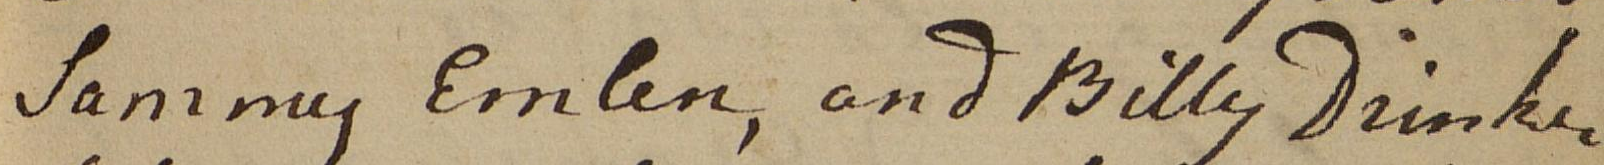Sammy Emlen, and Billy Drinker
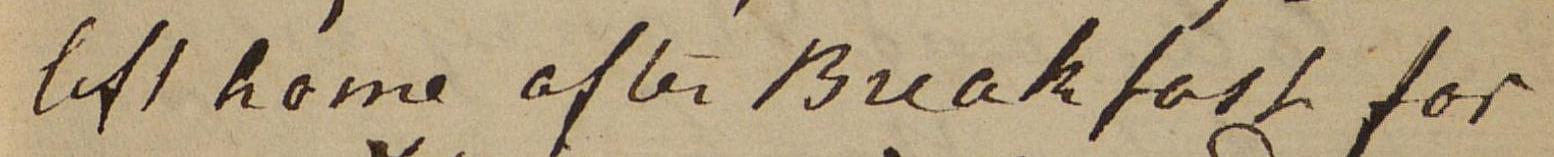left home after Breakfast for
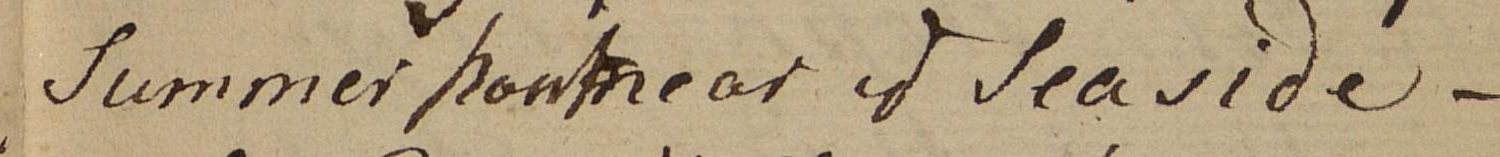Summer pont near y^e Seaside.
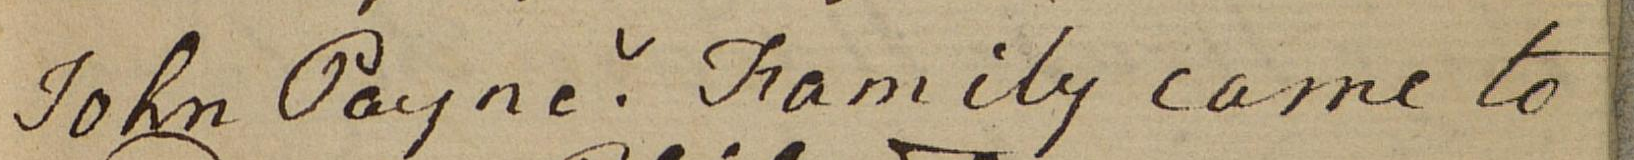John Payne^s. Family came to
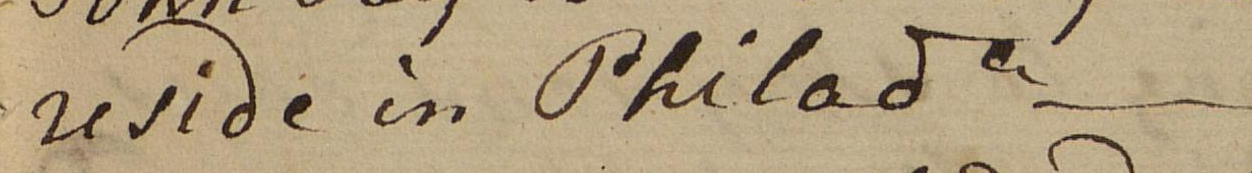reside in Philad^a-
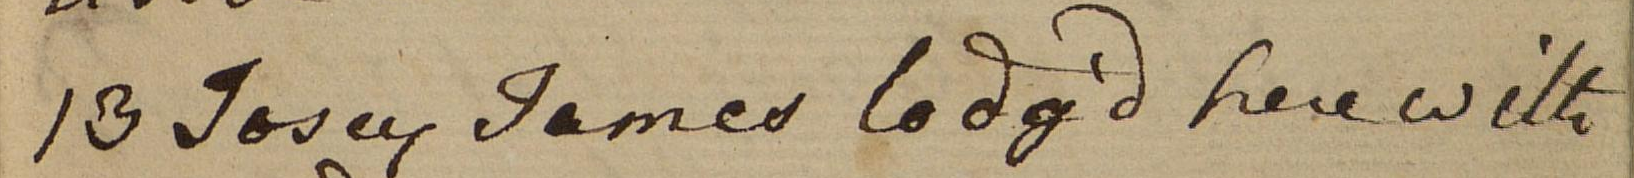13 Josey James lodg'd here with
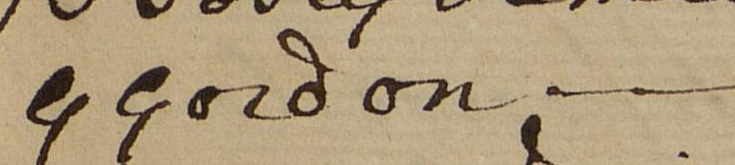G Gordon-
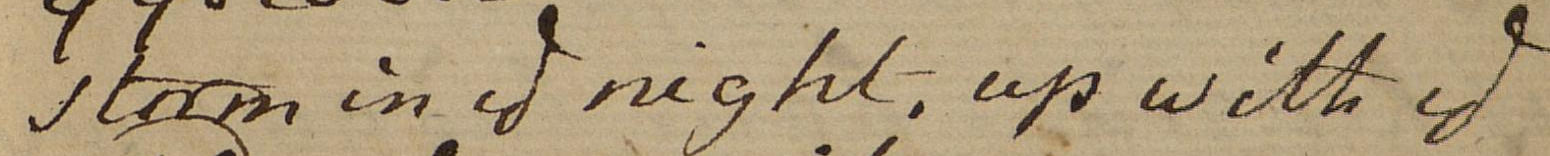storm in y^e night, up with y^e
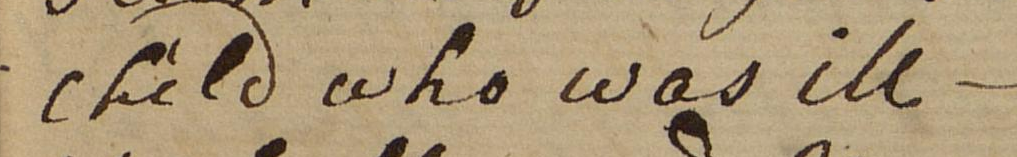child who was ill-
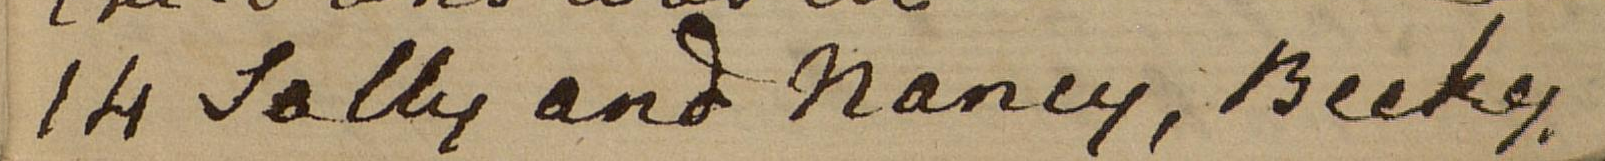14 Sally and Nancy, Becky
